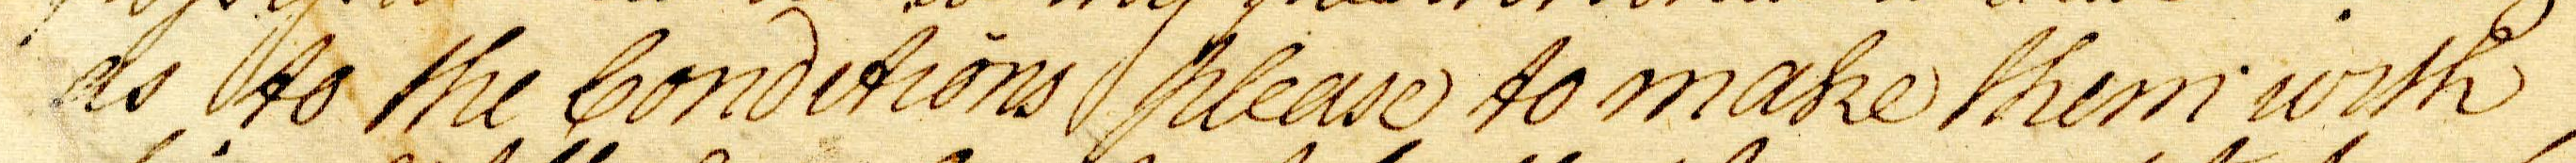is to the Conditions please to make them with
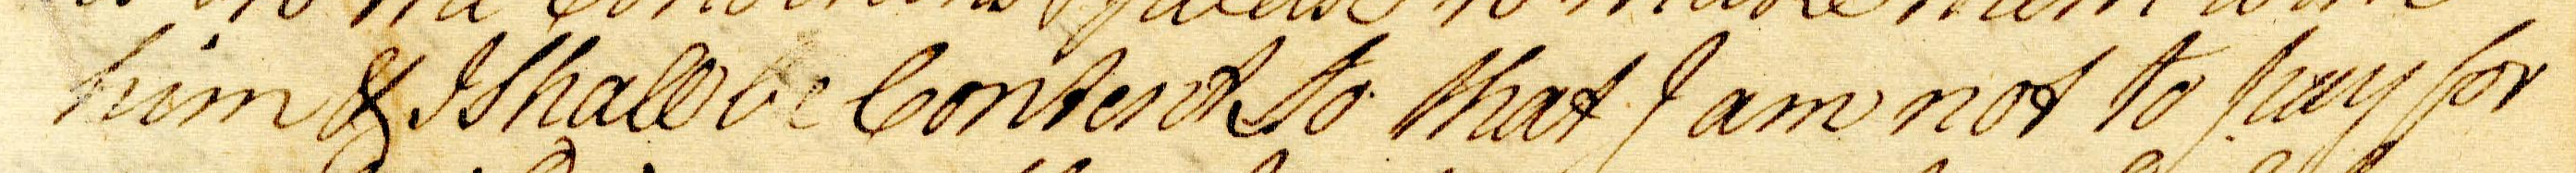him & I Shall be Content to that I am not to pay for
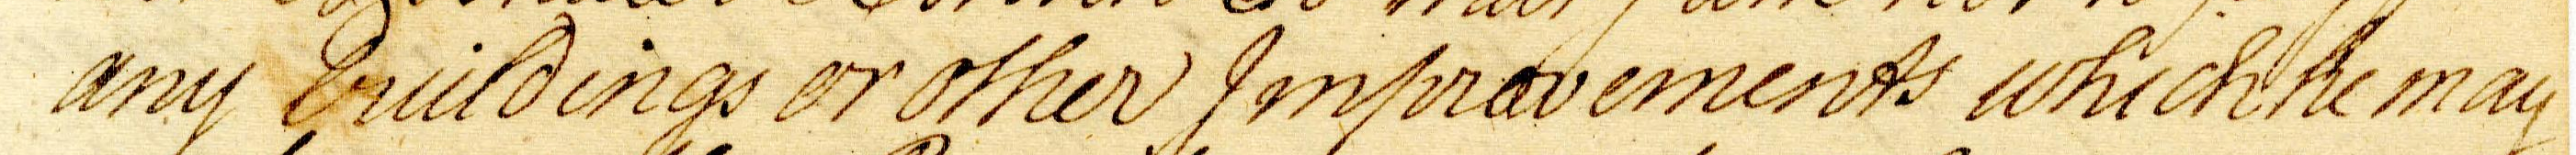any buildings or other Improvements which he may
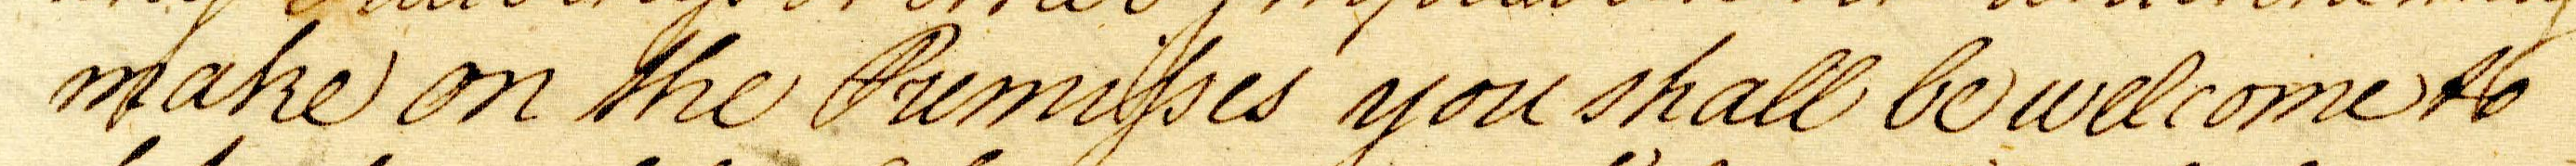make on the Premisses you shall be welcome to
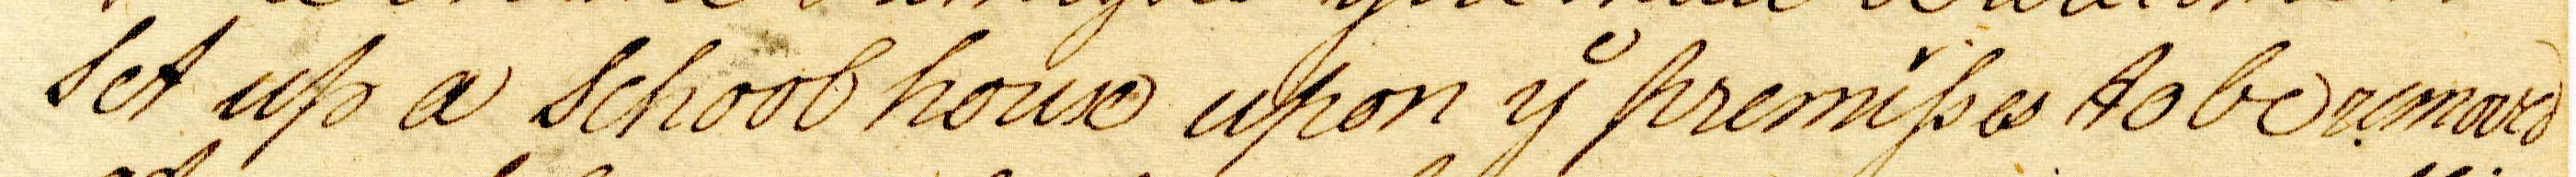Set up a School house upon y^e premisses to be removed
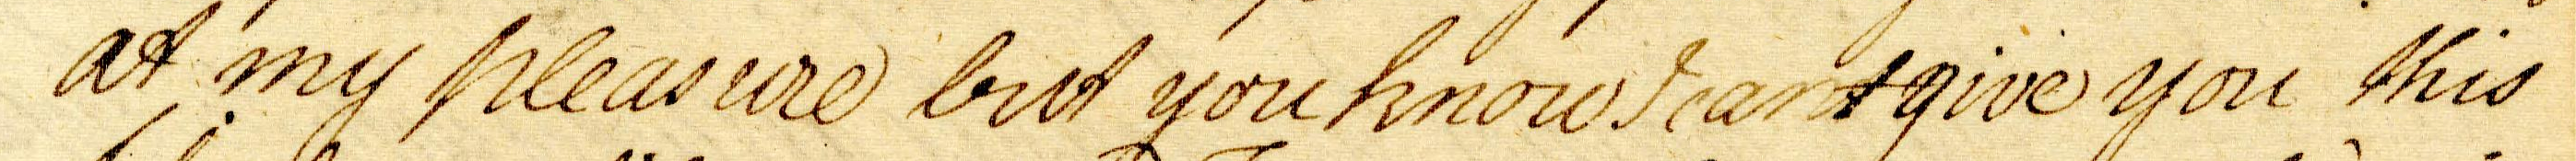at my pleasure but you know I cant give you this
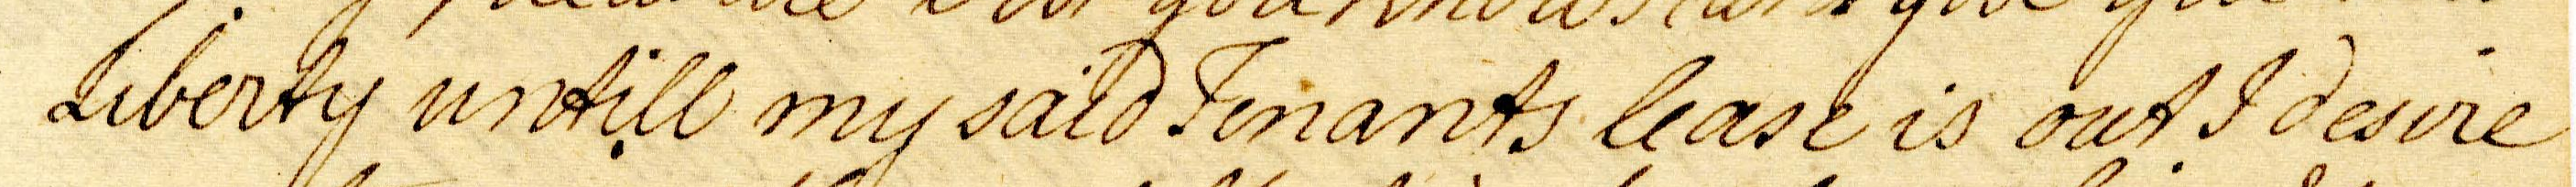Liberty untill my said Tenants lease is out I desire
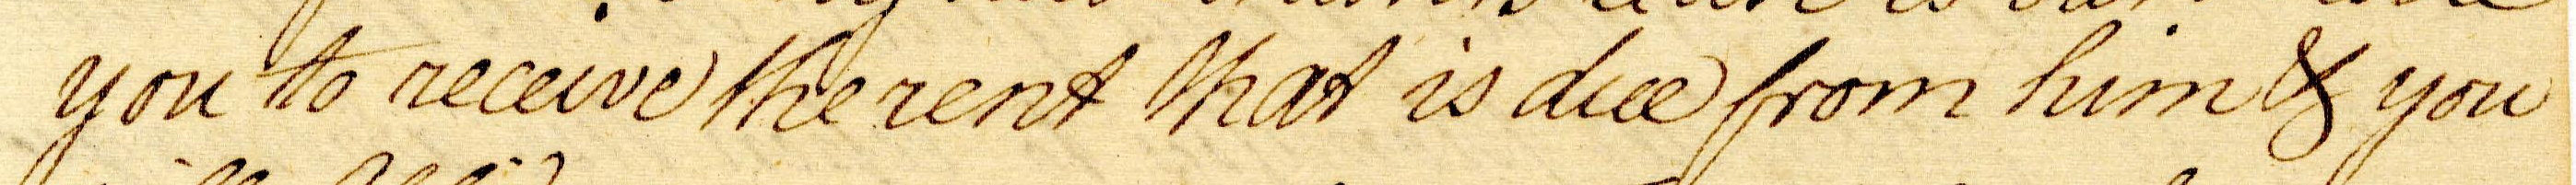you to receive the rent that is due from him & you
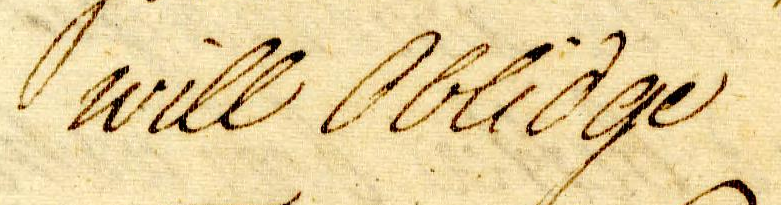will Oblidge
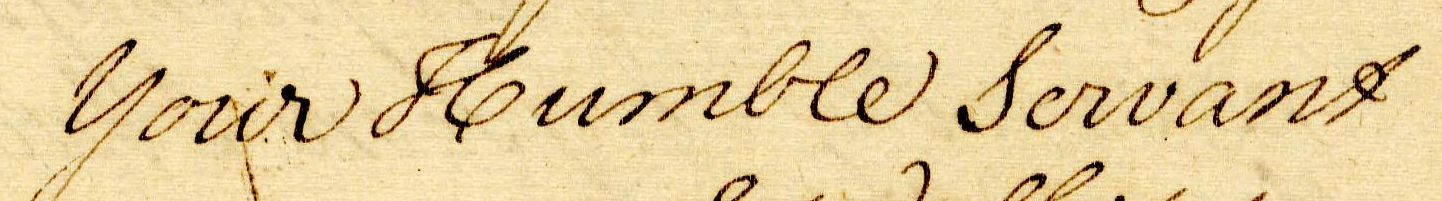Your Humble Servant
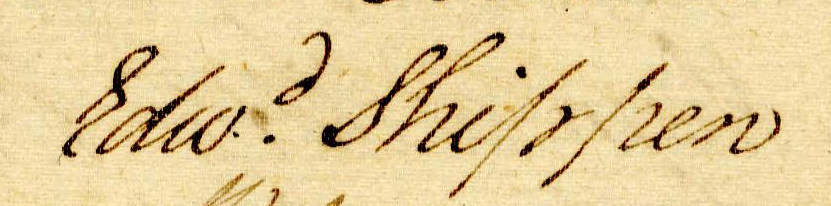Edw^d. Shippen
